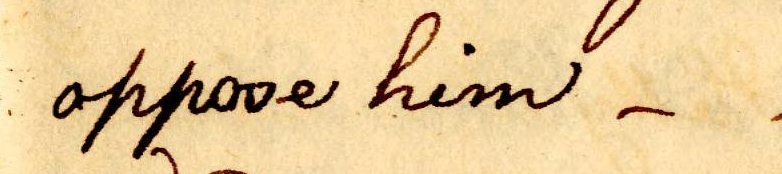oppose him-
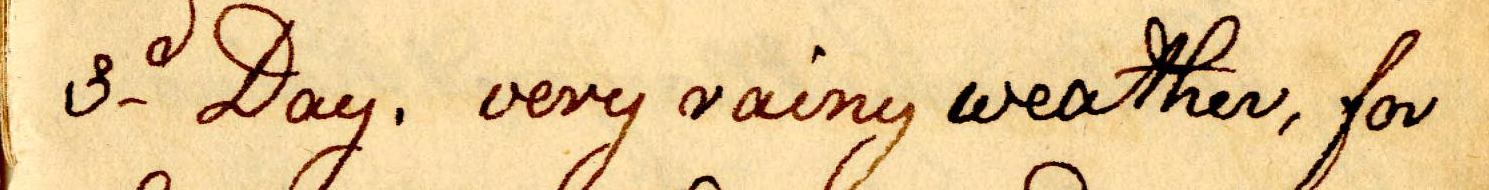3^d Day. very rainy weather, for
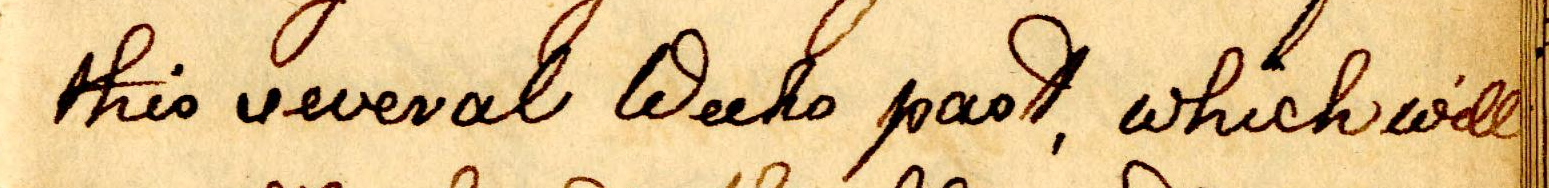this several Weeks past, which will
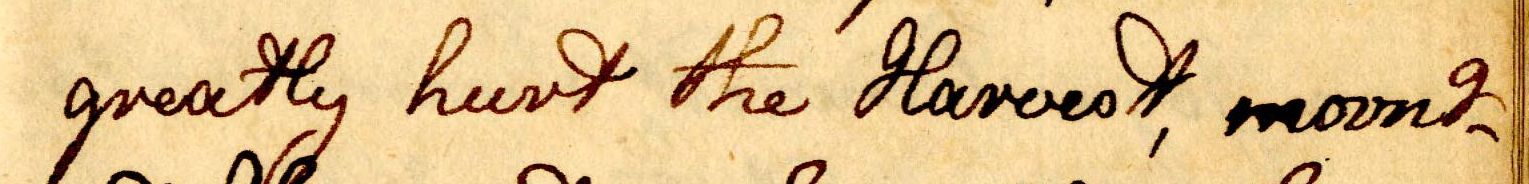greatly hurt the Harvest, morn^g
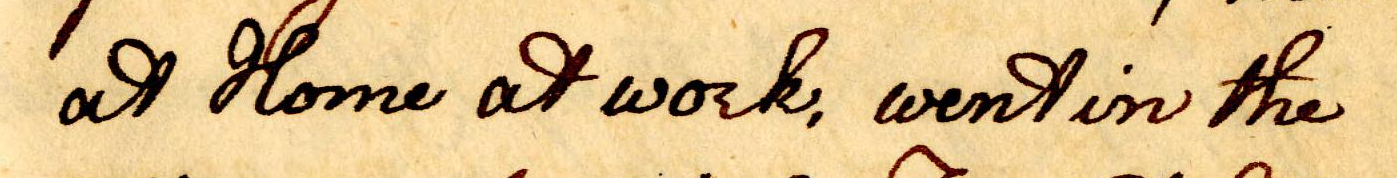at Home at work, went in the
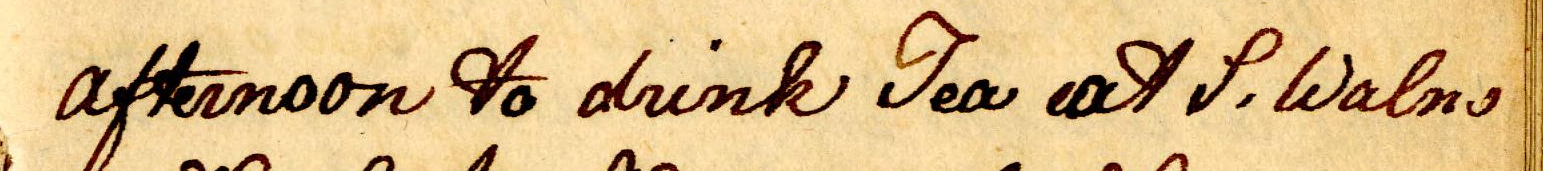Afternoon to drink Tea at S. Walns
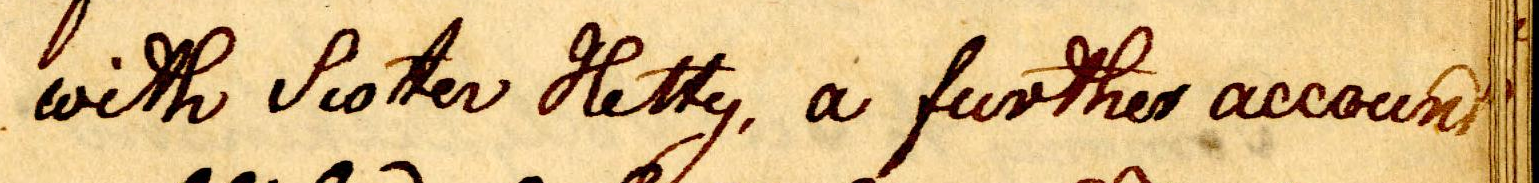with Sister Hetty, a further account
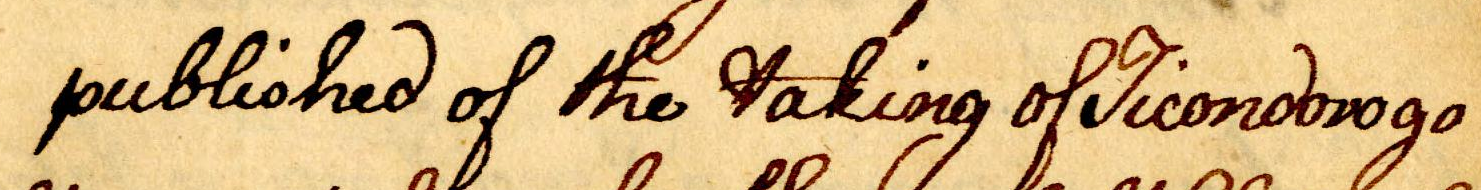published of the taking of Ticondorogo
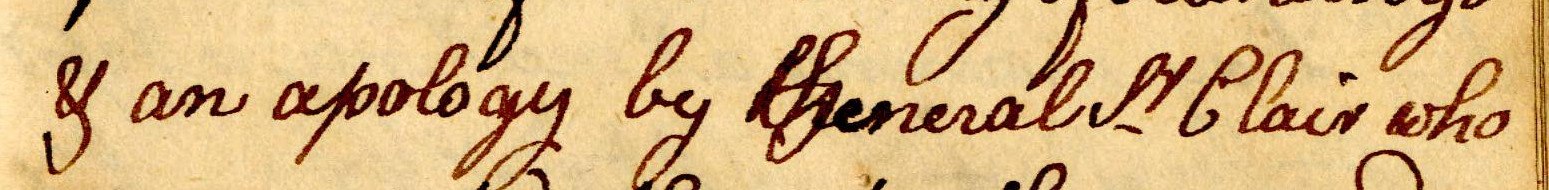& an apology by General S^t Clair who
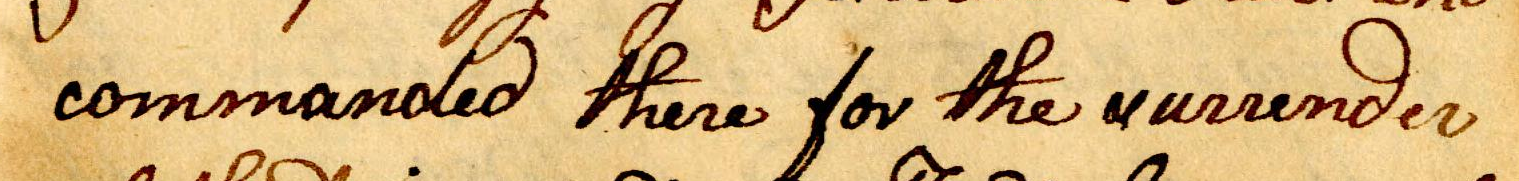commanded there for the surrender
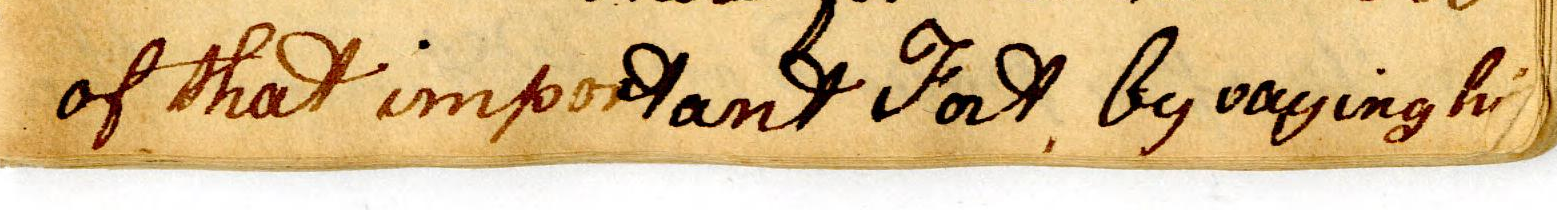of that important Fort, by sayin h[i]
